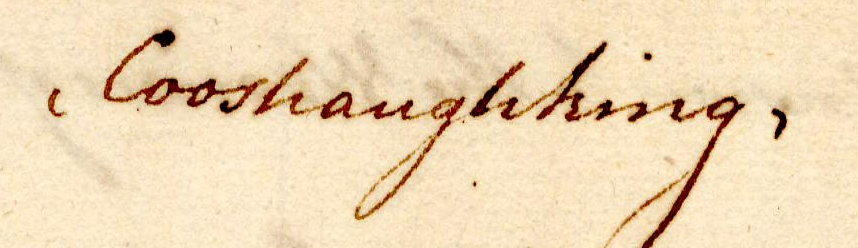Cooshaughking,
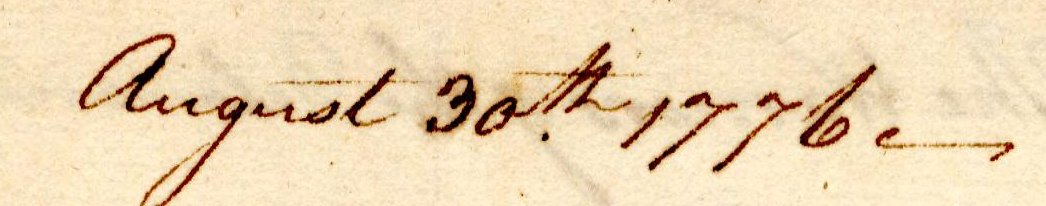August 30^th. 1776-
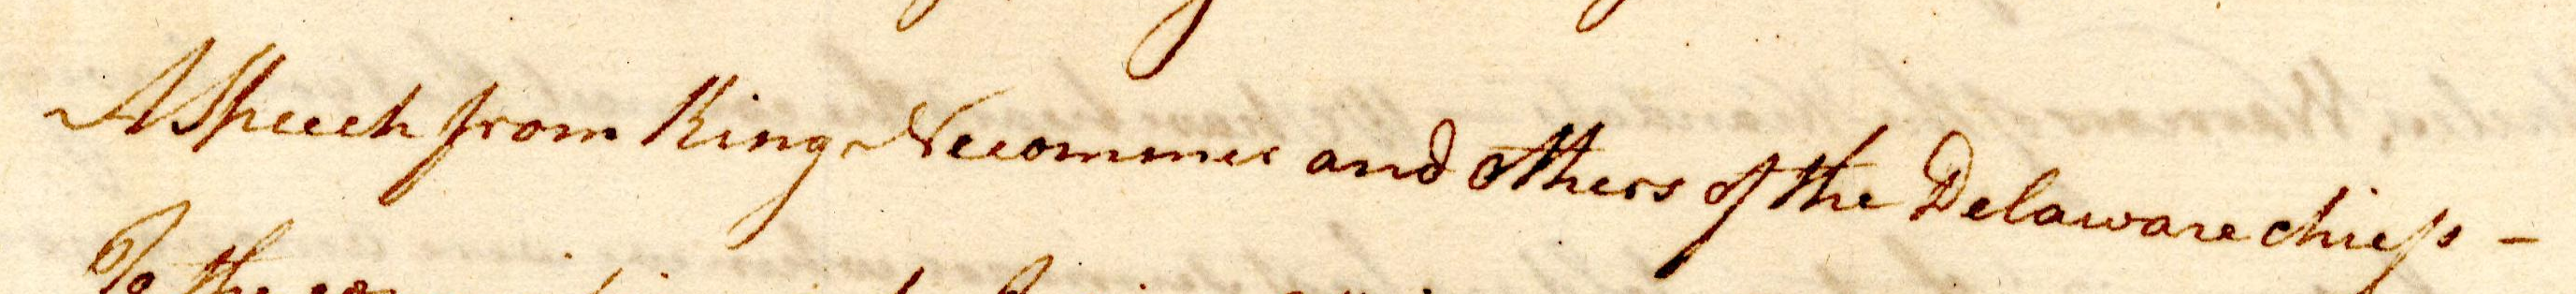A Speech from King Necommer and others of the Delaware chiefs-
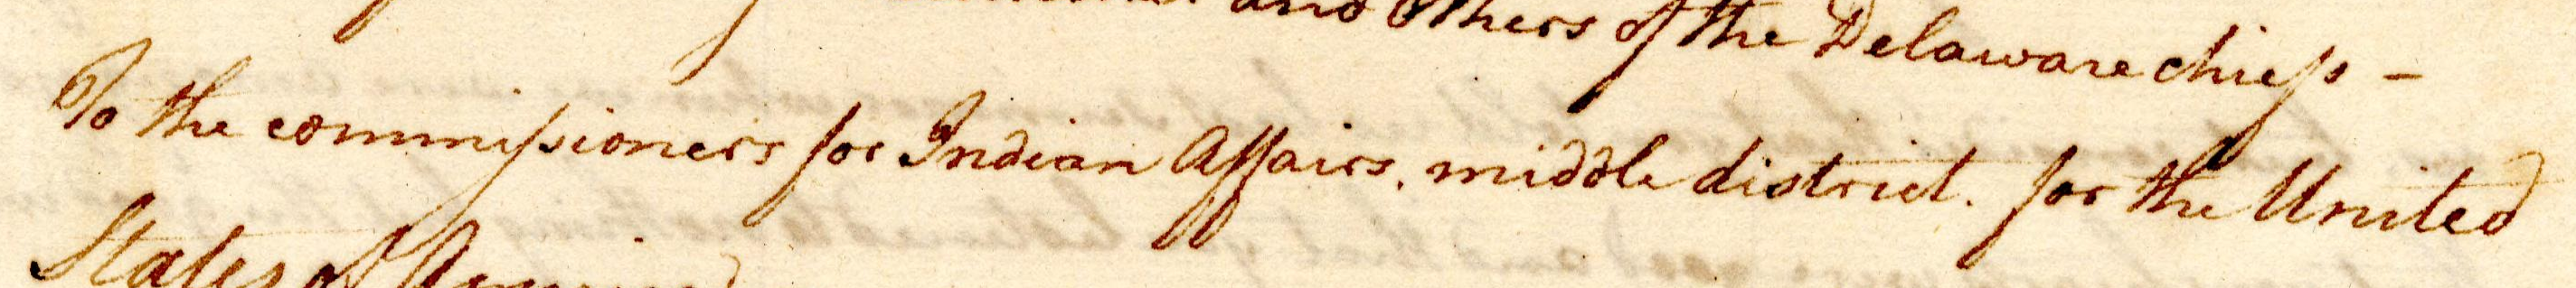To the commissioners for Indian Affairs, middle district for the United
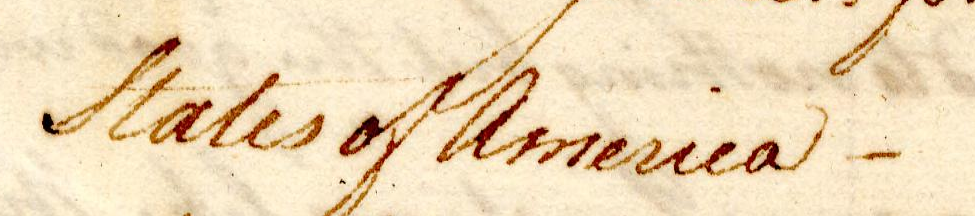States of America-
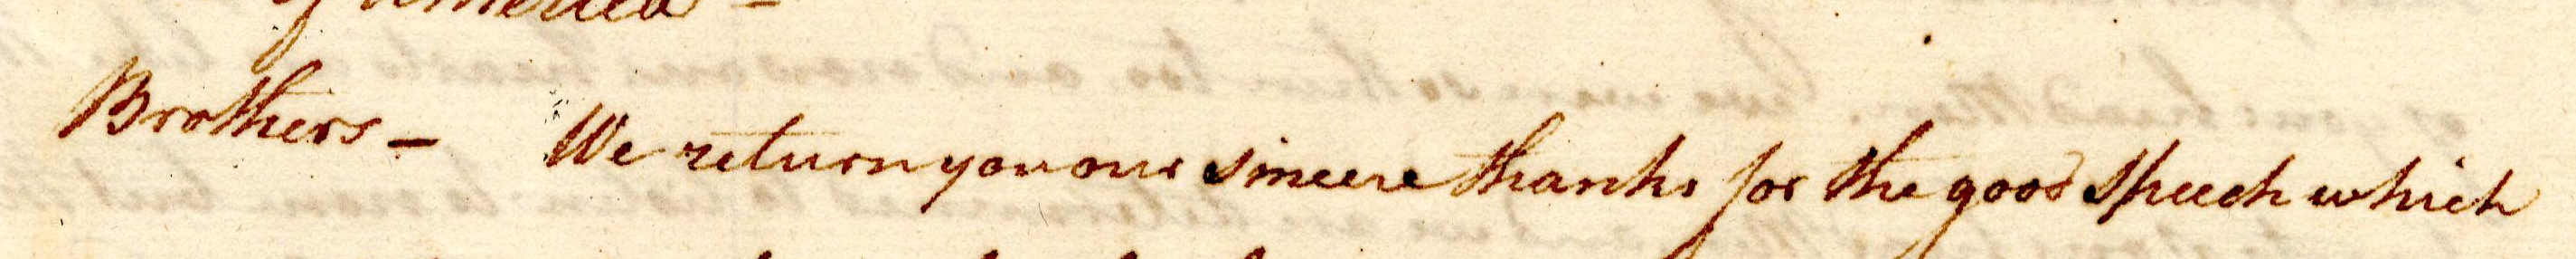Brothers- We return you our sincere thanks for the good Speech which
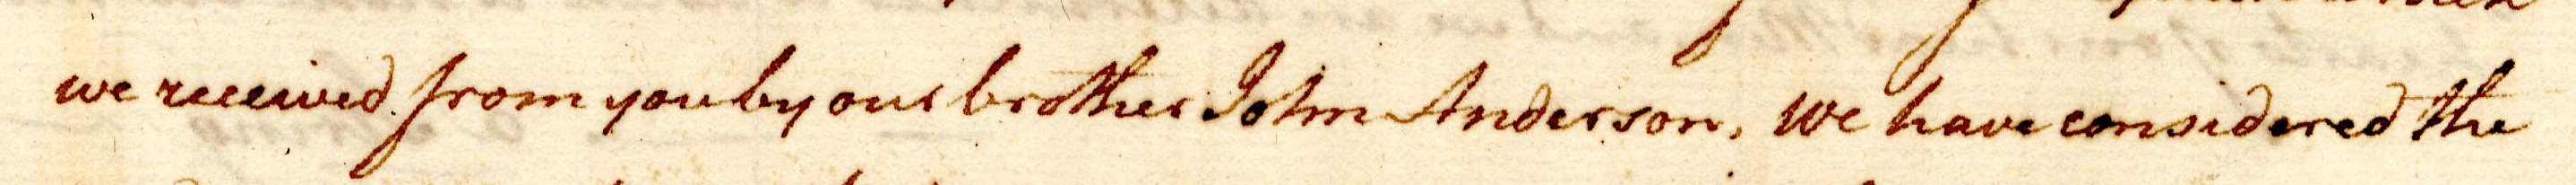we received from you by our brother John Anderson, We have considered the
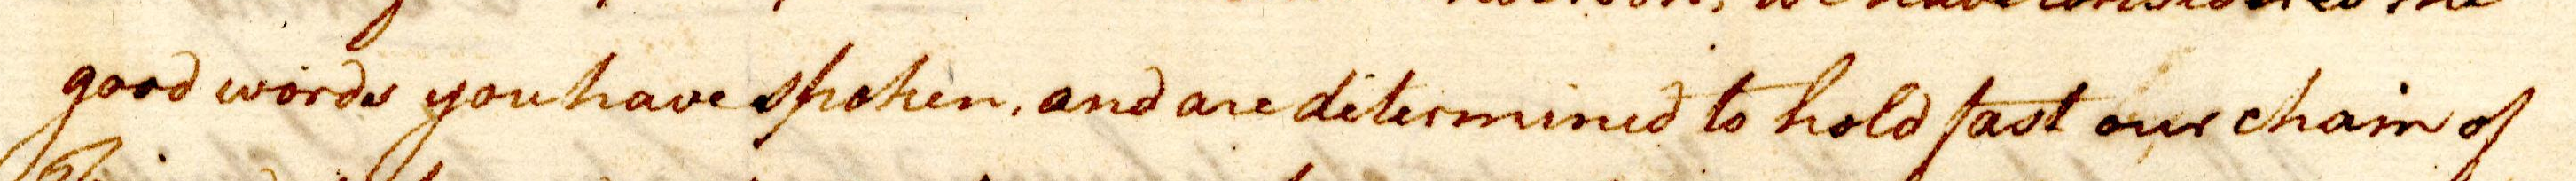good words you have spoken, and are determined to hold fast our chain of
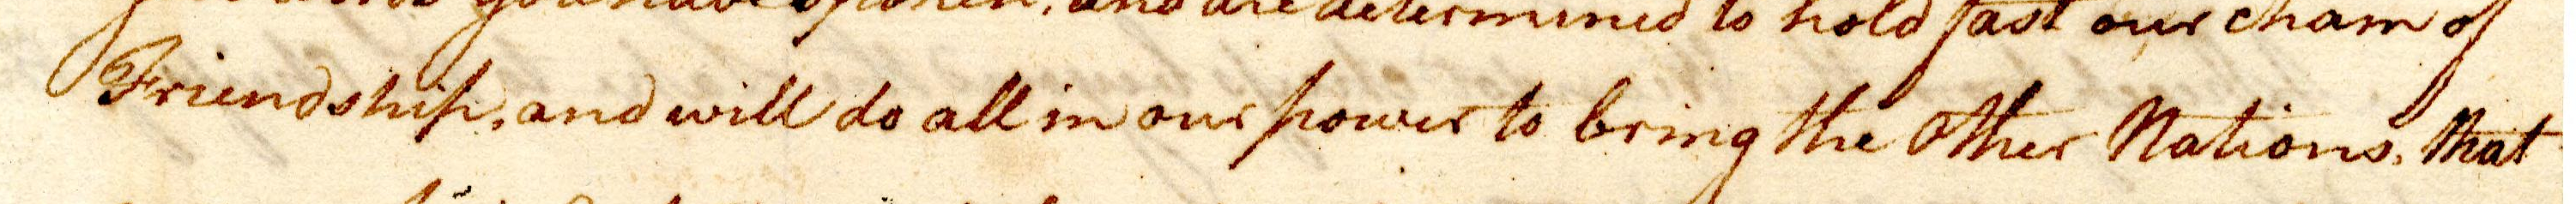Friendship, and will do all in our power to bring the other Nations, that
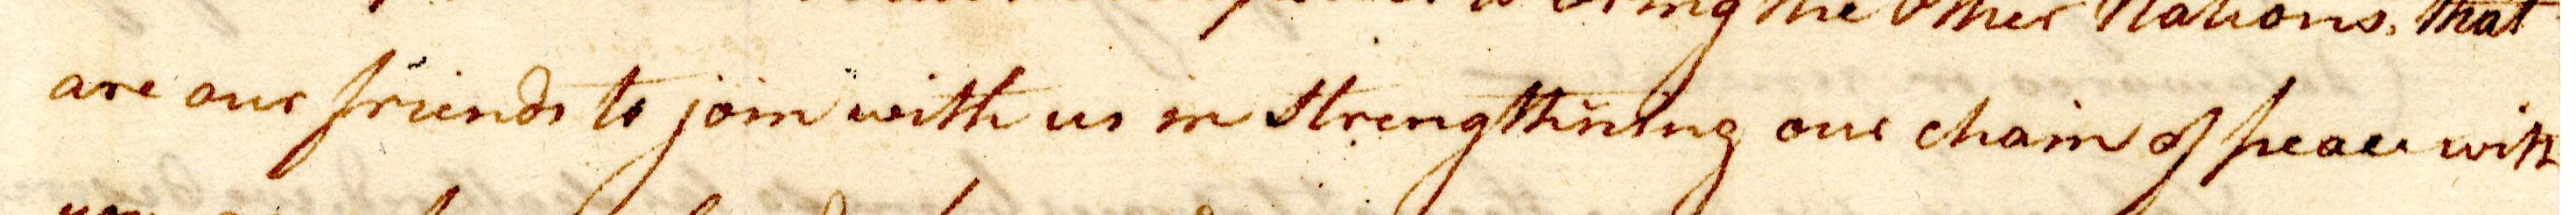are our friends to join with us in Strengthening our chain of peace with
